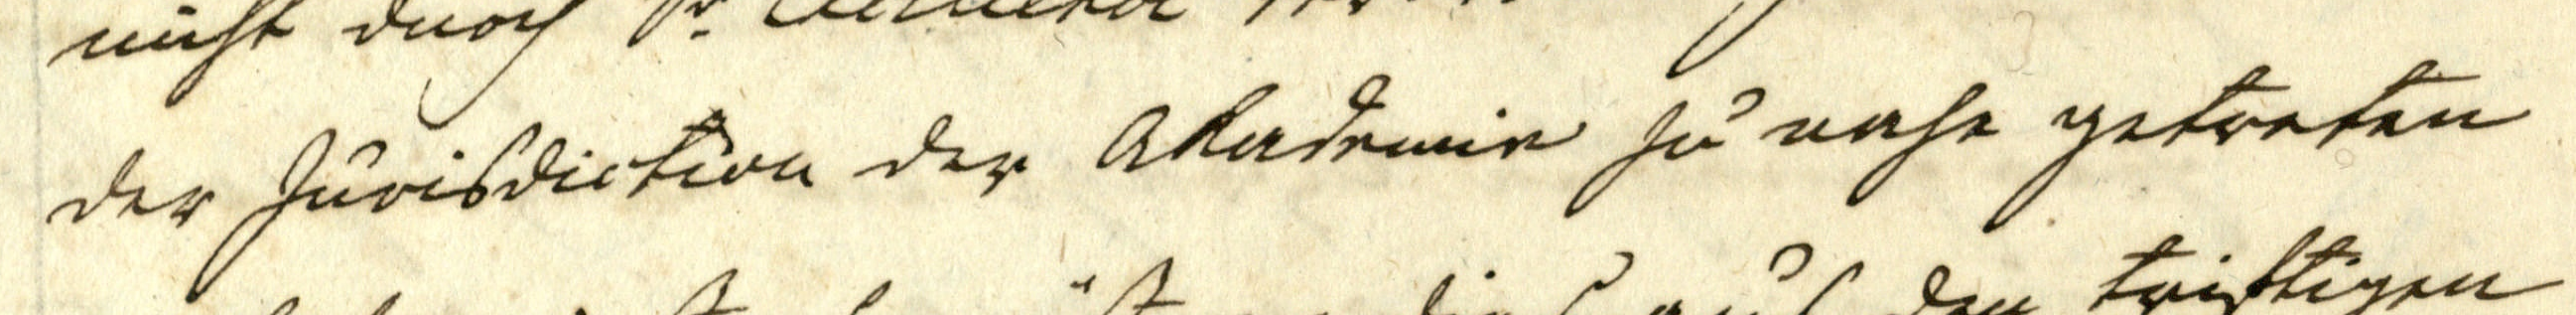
der Jurisdiction der Akademie zu nahe getreten
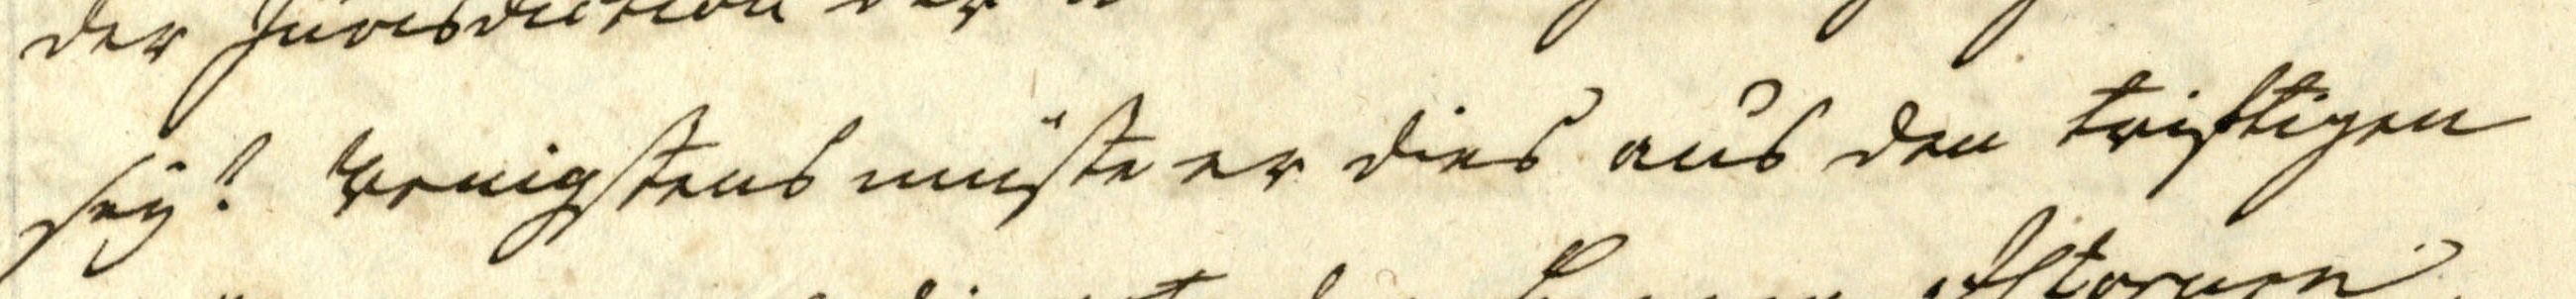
seÿ? Wenigstens müßte er dies aus den triftigen
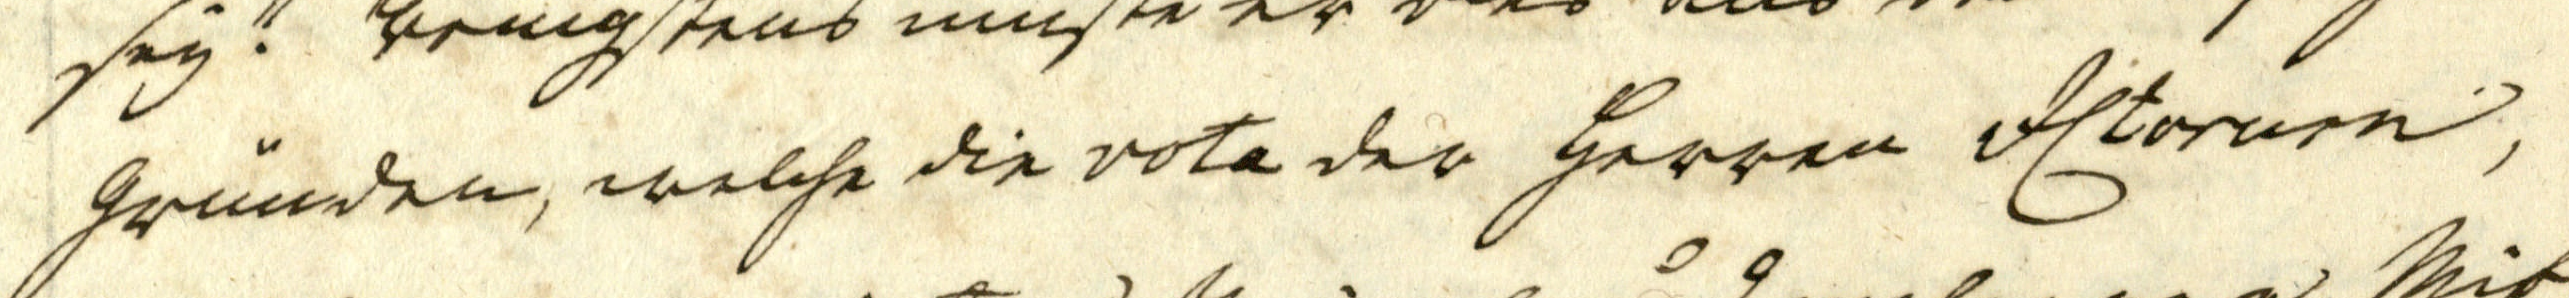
Gründen, welche die vota der Herren Iltorum,
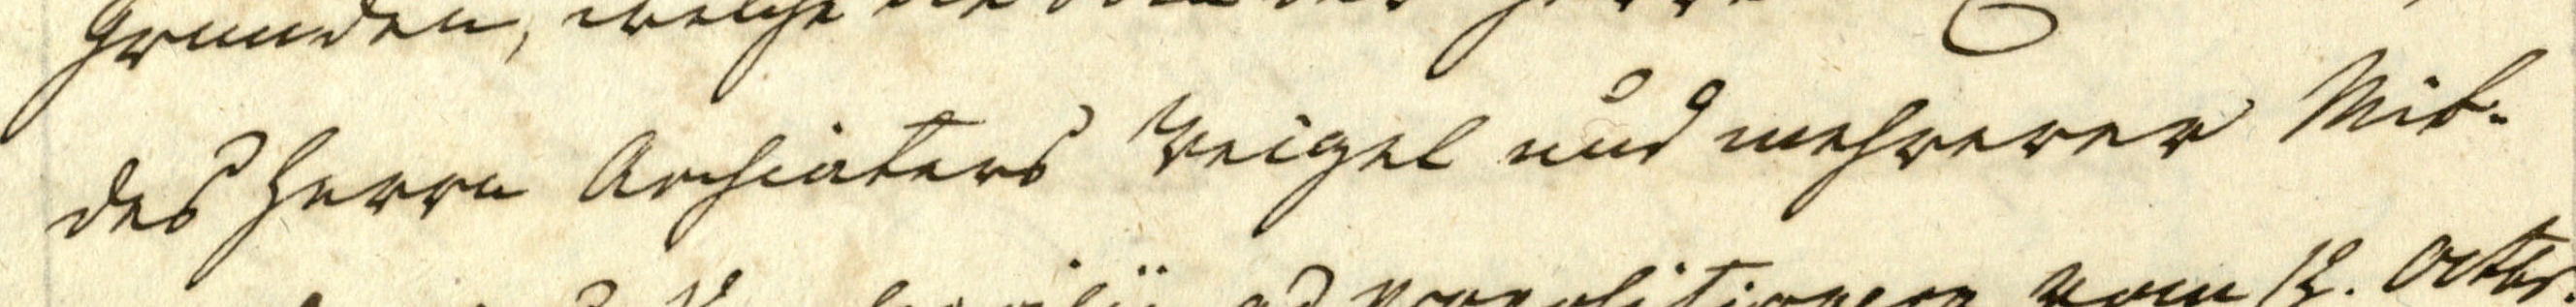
des Herrn Archiaters Weigel und mehrerer Mit¬
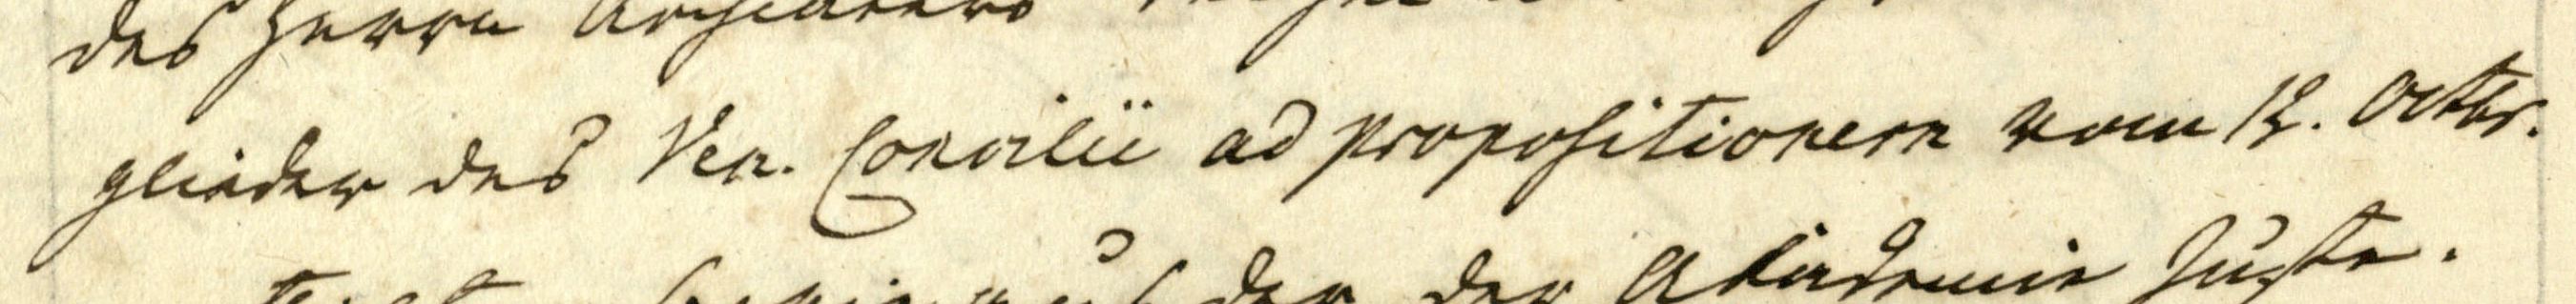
glieder des Ven. Concilii ad propositionem vom 12. Octbr.
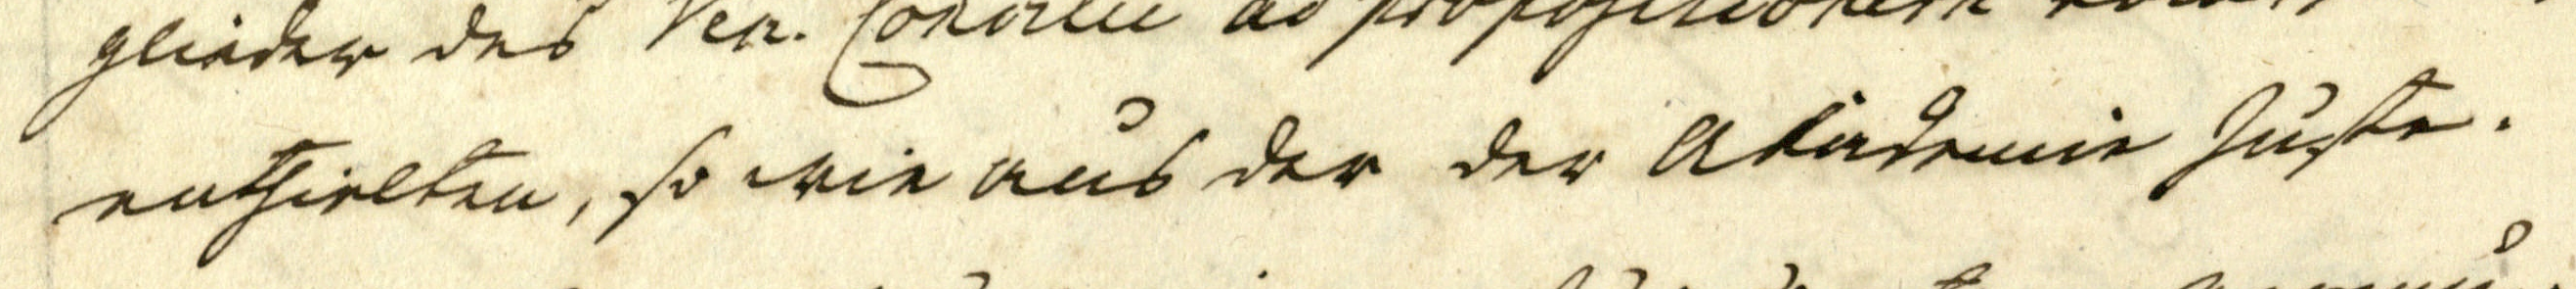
enthielten, so wie aus der der Akademie zuste¬
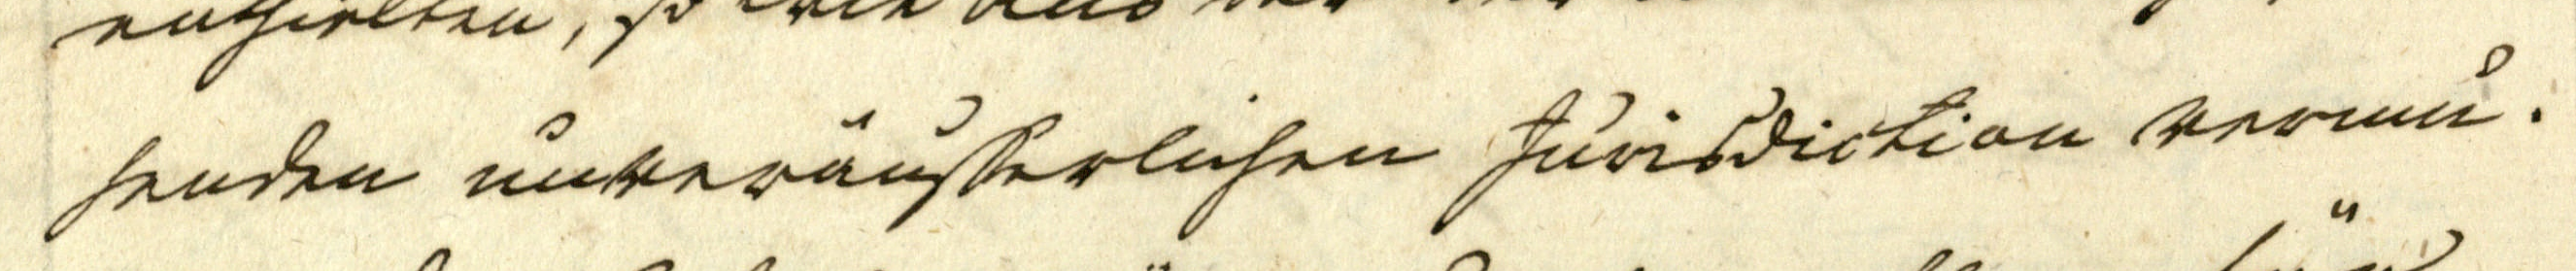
henden unveräusserlichen Jurisdiction vermu¬
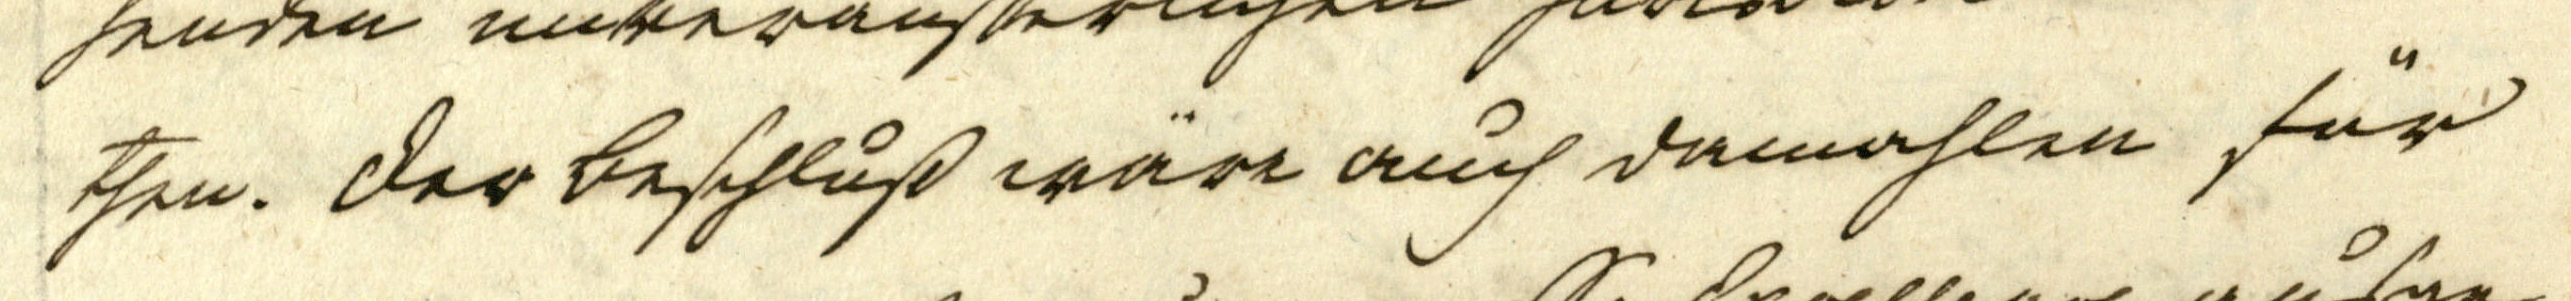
then. Der Beschluß wäre auch damnahlen für
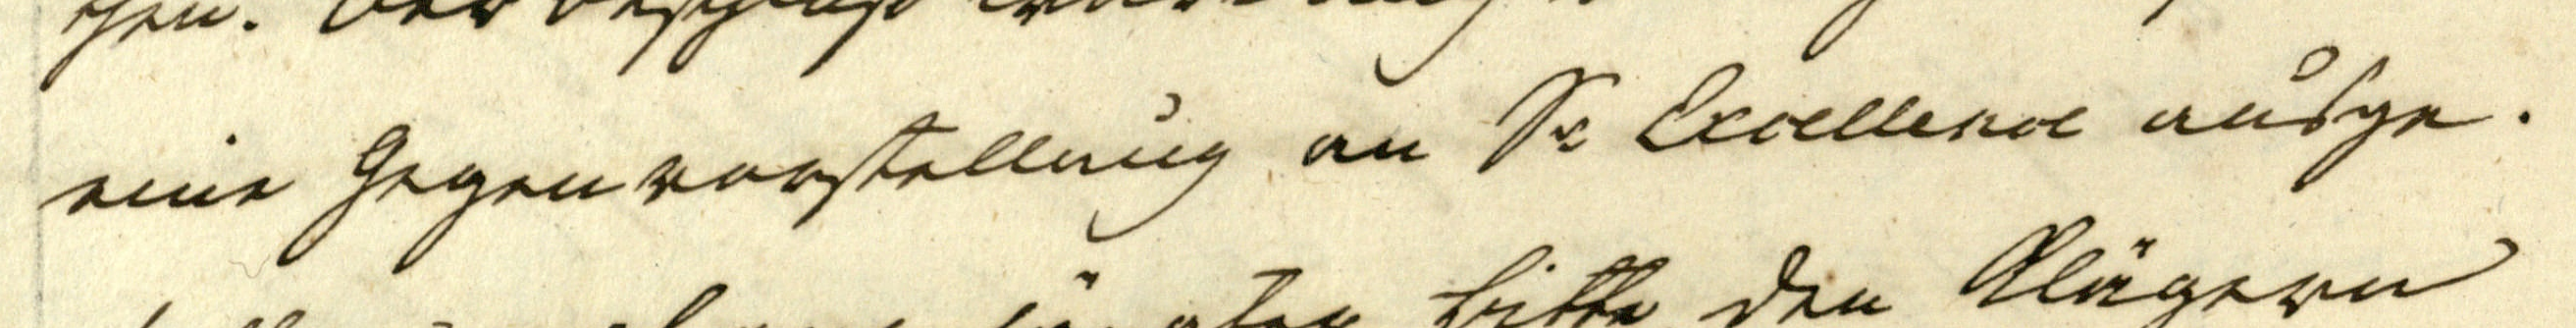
eine Gegen vorstellung an Sr Excellence ausge-
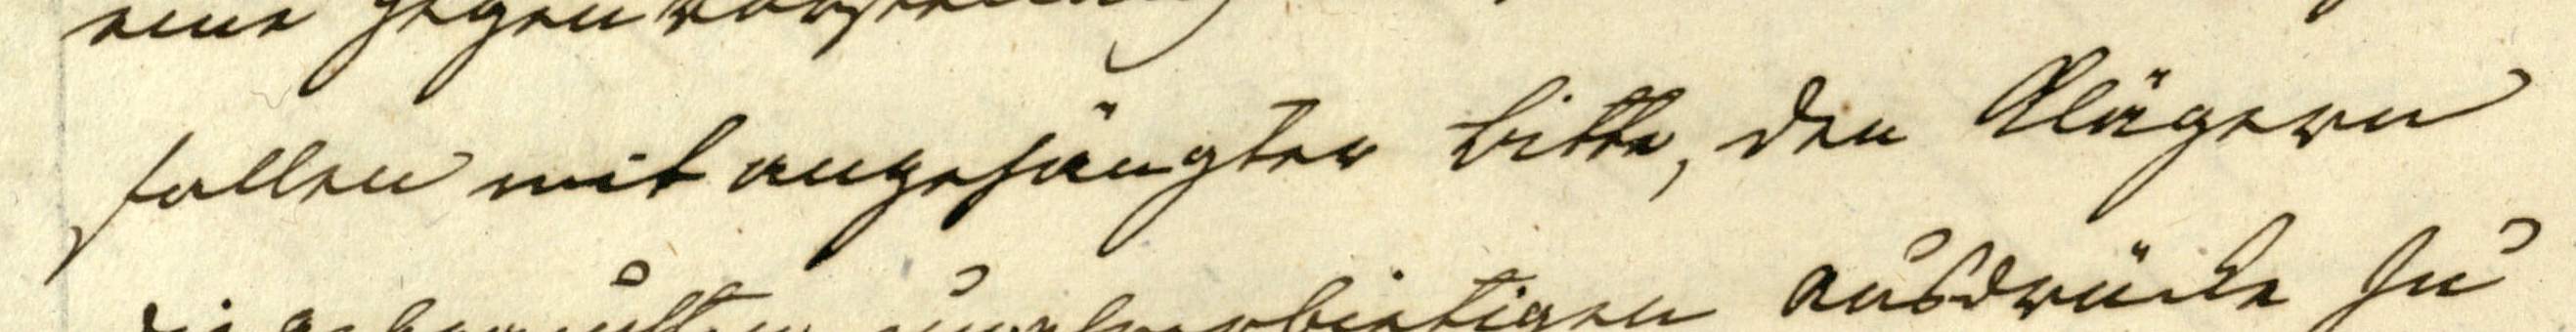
fallen mit angehängter Bitte, den Klägern
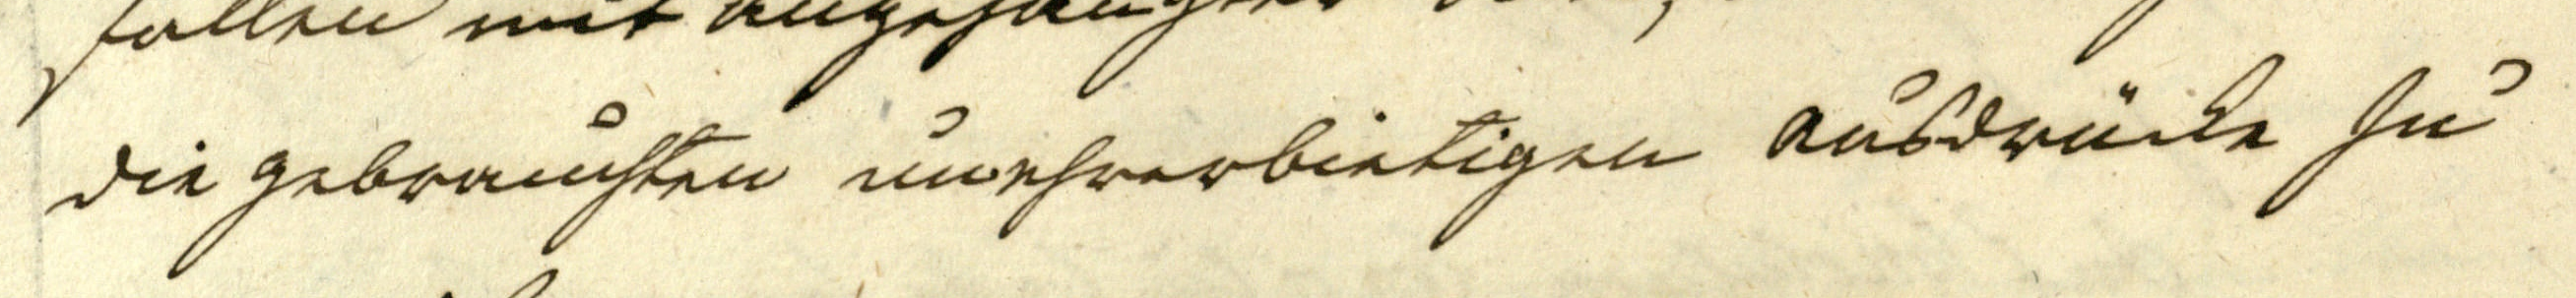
die gebrauchten unehrbietigen Ausdrücke zu
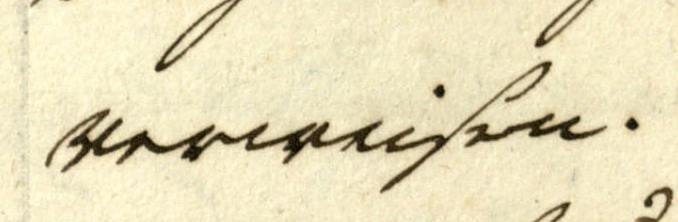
verweisen.
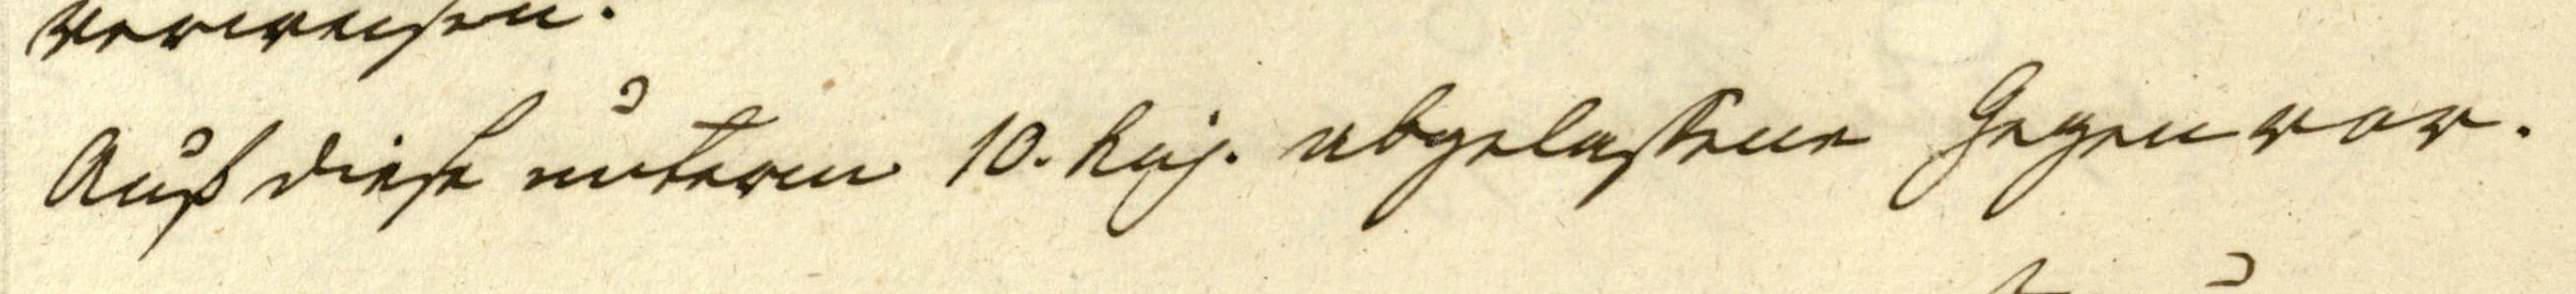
Auf diese unterm 10. huj. abgelassenen Gegen vor¬
